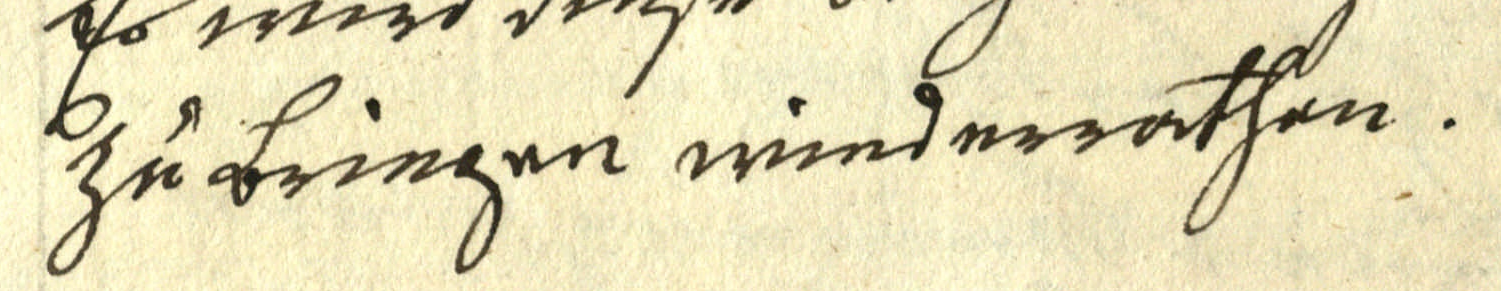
zu bringen wiederrathen.
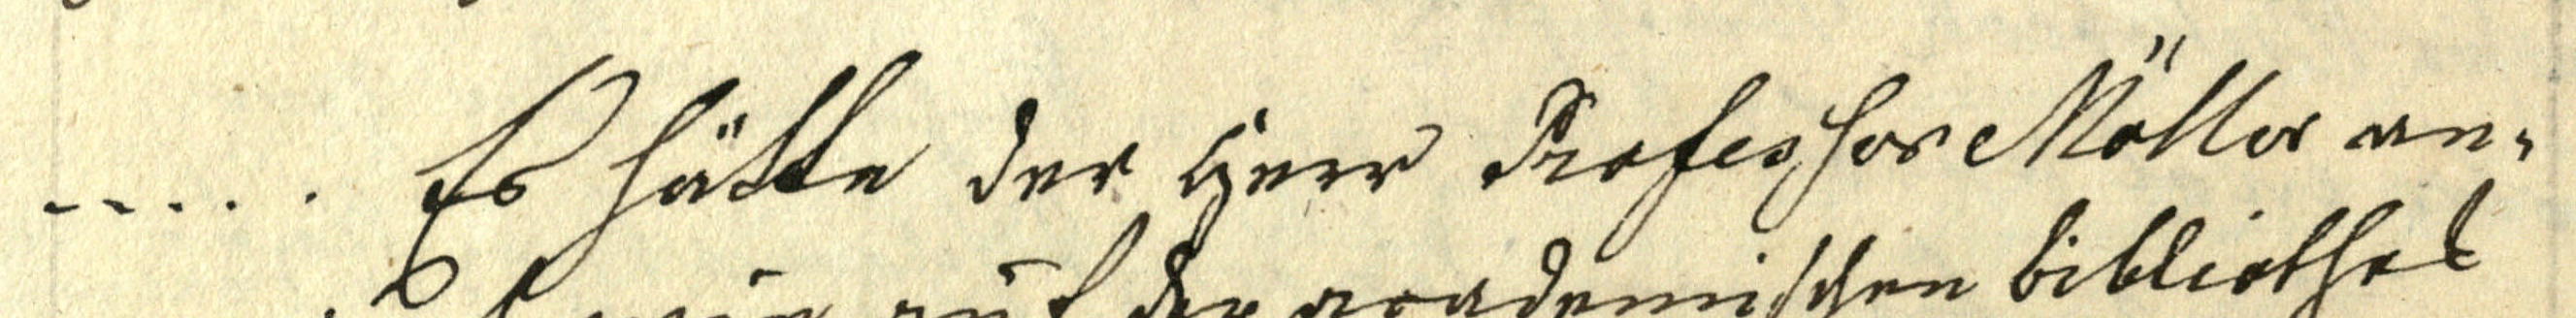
Es hätte der Herr Professor Möller an¬
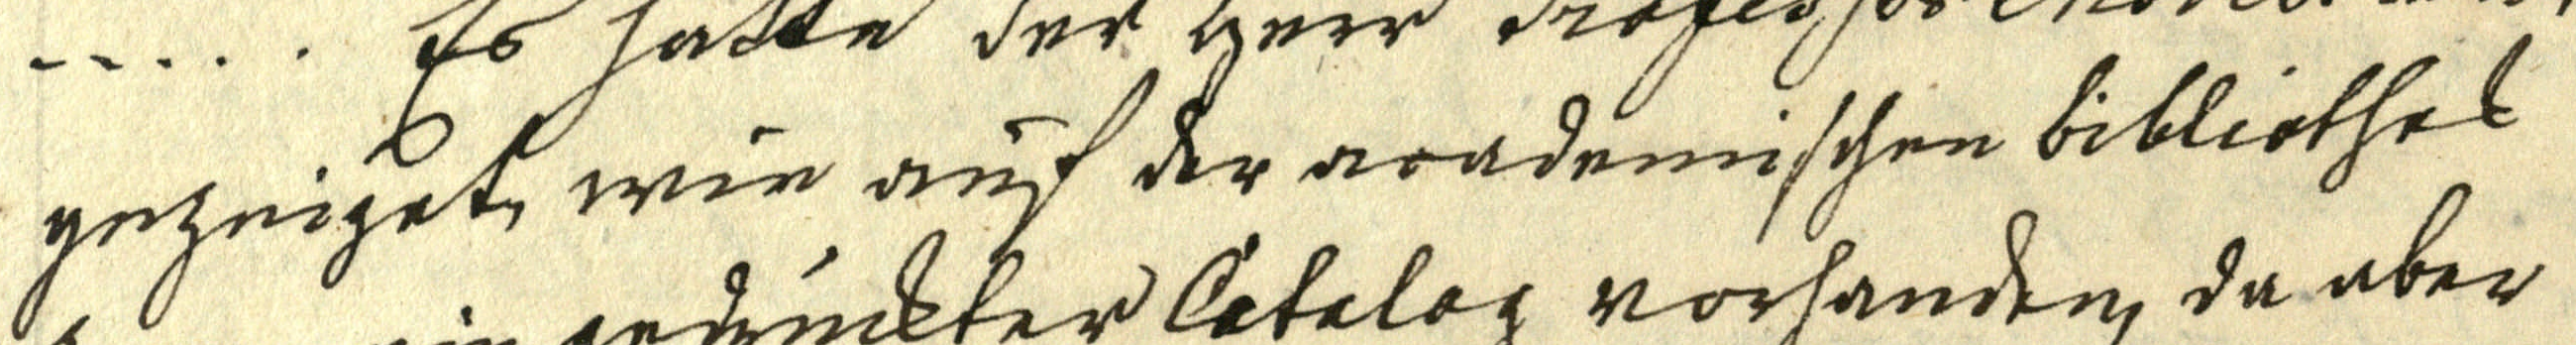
gezeiget, wie auf der academischen Bibliothek
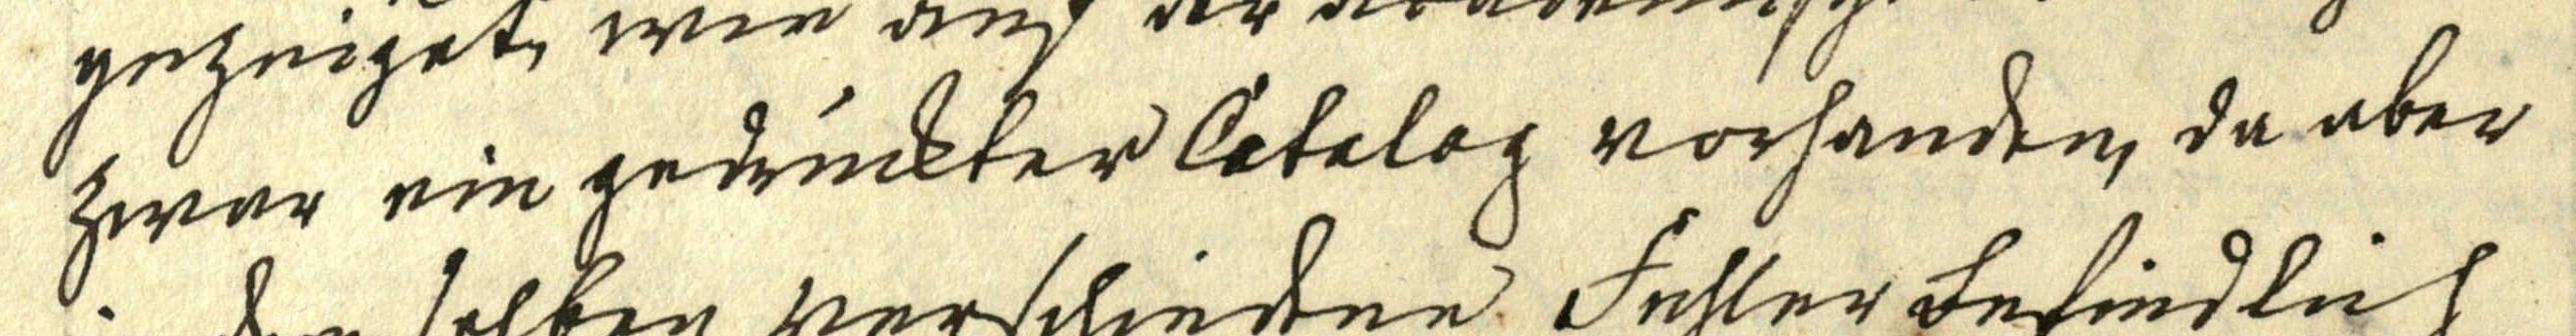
zwar ein gedruckter Catalog vorhanden, da aber
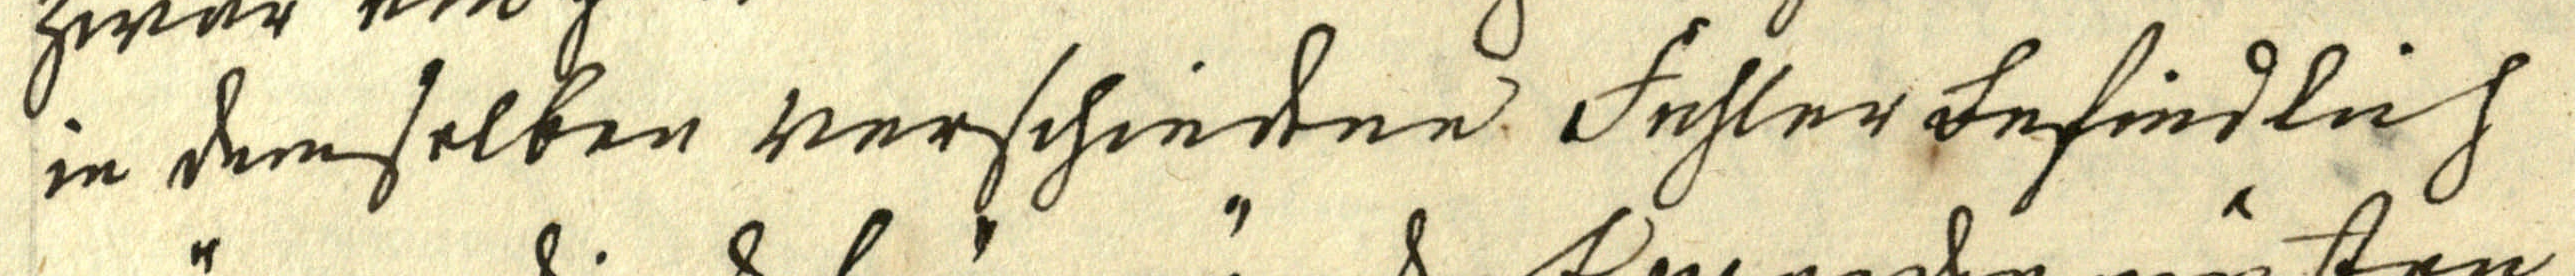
in demselben verschiedene Fehler befindlich
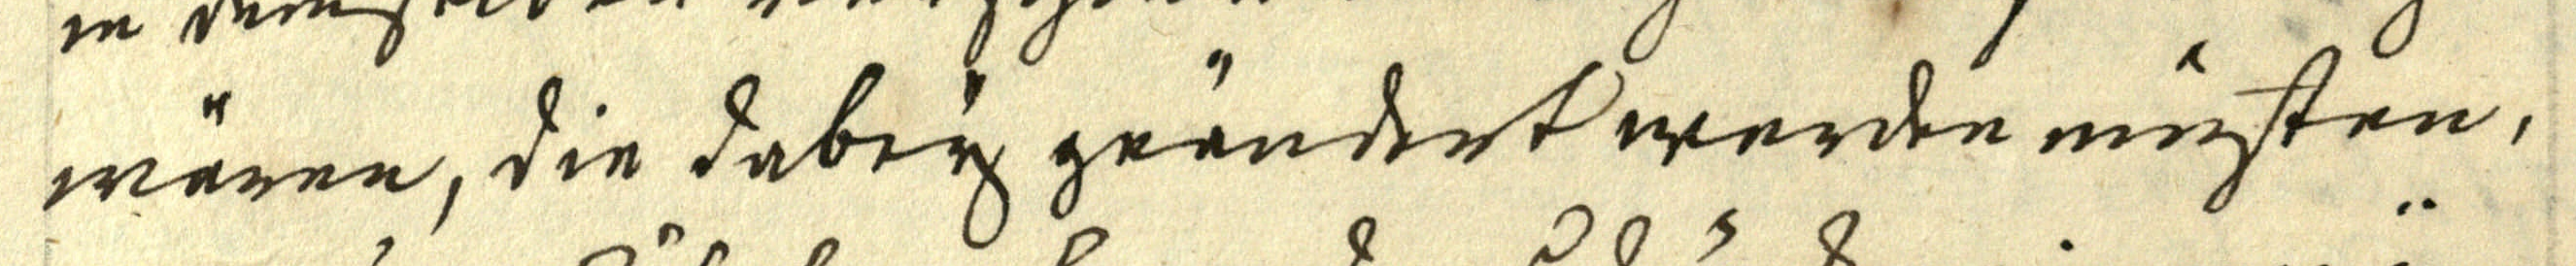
wären, die dabeÿ geändert werden müsten,
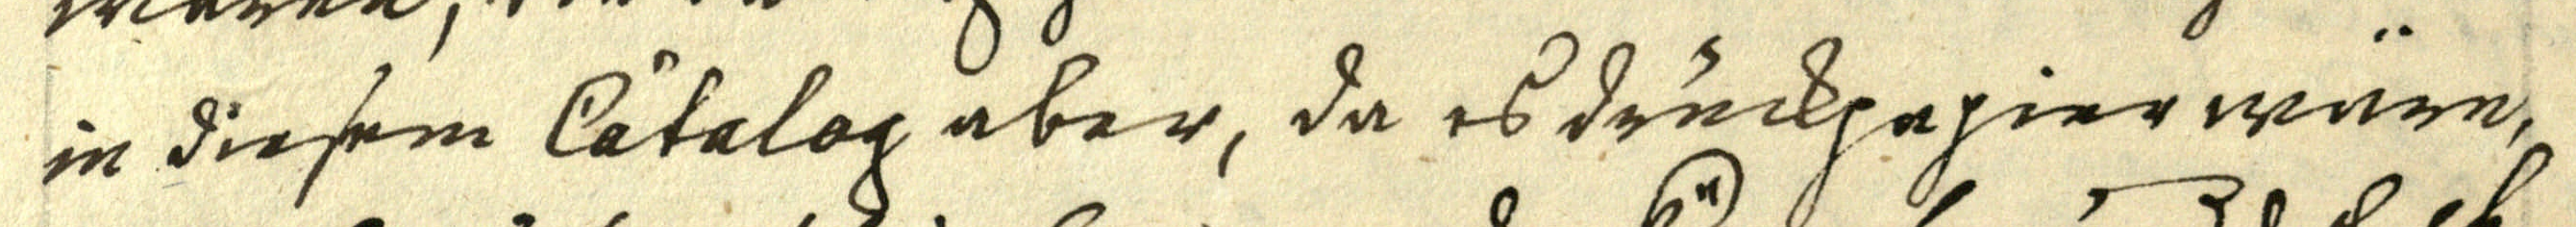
in diesem Catalog aber, da es druckpapier wäre,
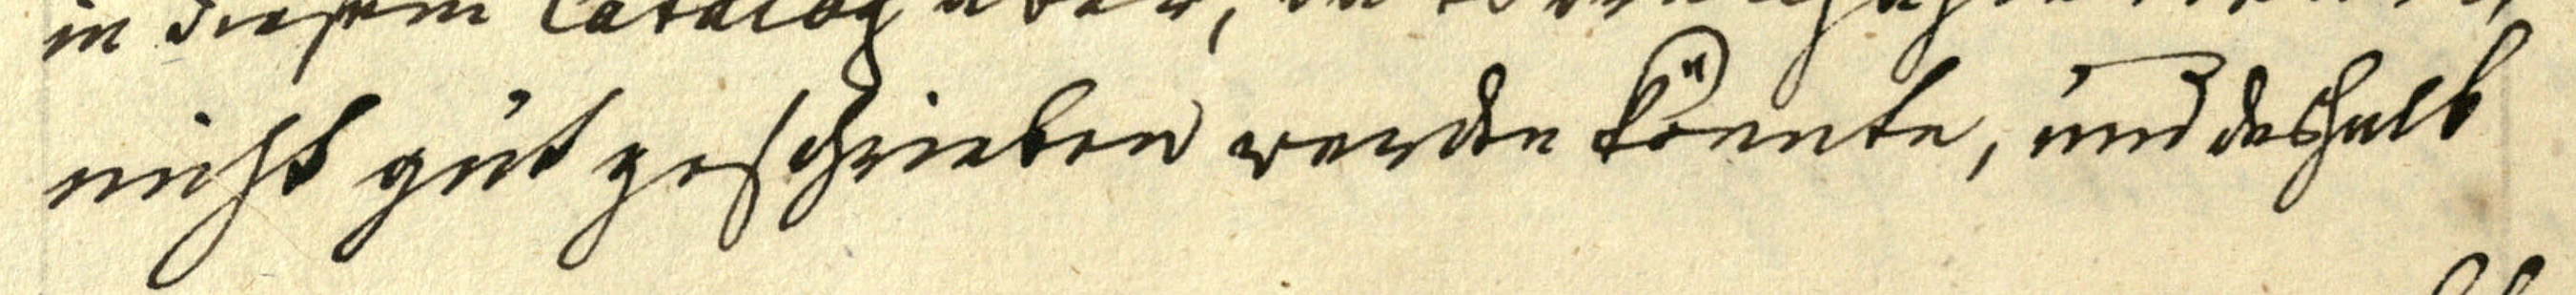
nicht gut geschrieben werden könnte, und deshalb
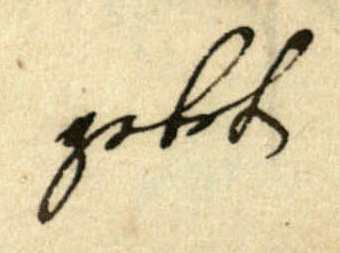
gehet
